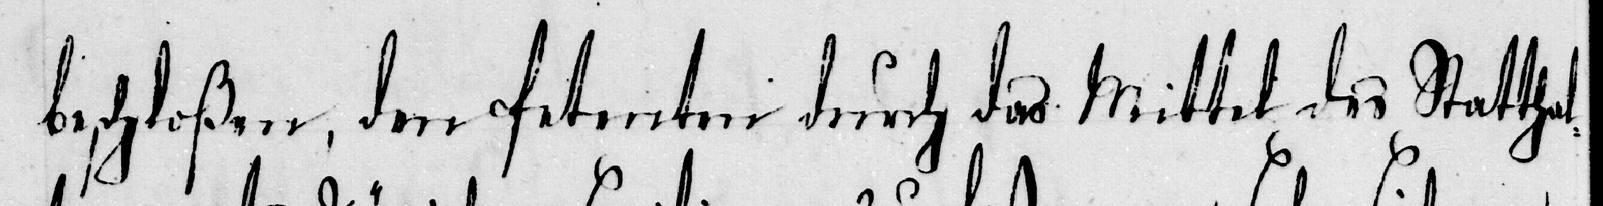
beschloßen, den Petenten durch das Mittel des Statt¬
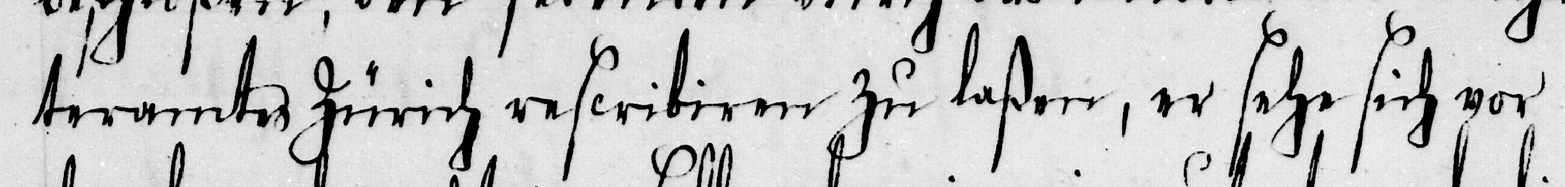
teramtes Zürich rescribiren zu laßen, er sehe sich vor
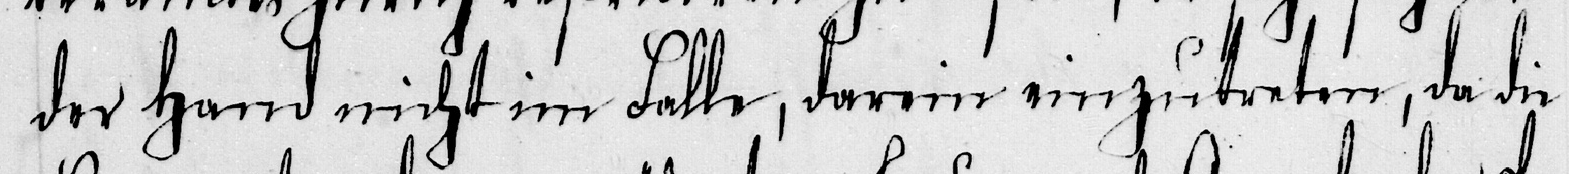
der Hand nicht im Falle, darein einzutreten, da die
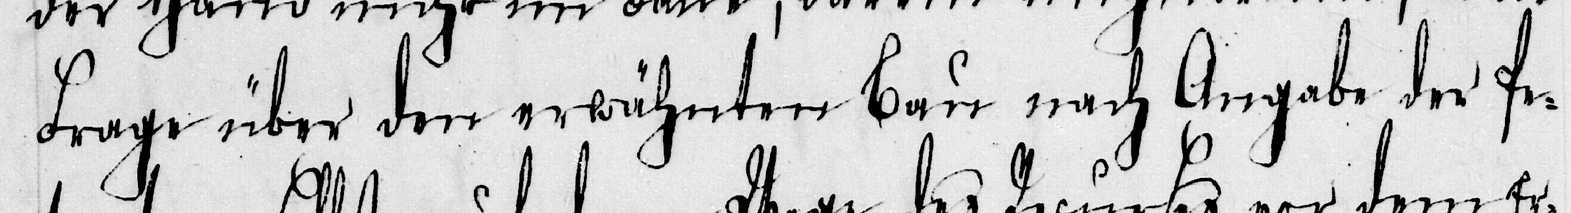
Frage über den erwähnten Bau nach Angabe der Pe¬
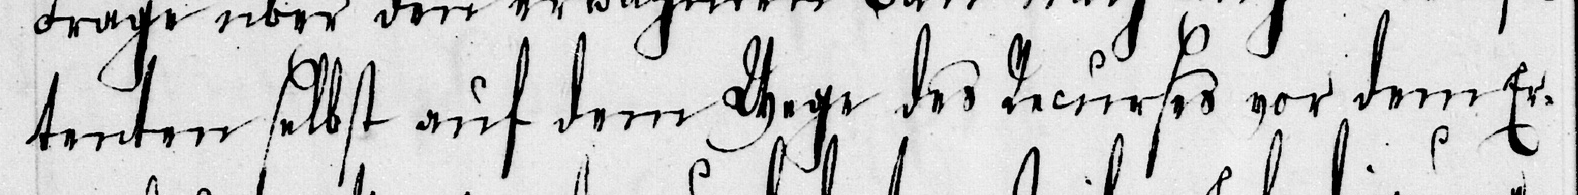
tenten selbst auf dem Wege des Recurses vor dem Er¬
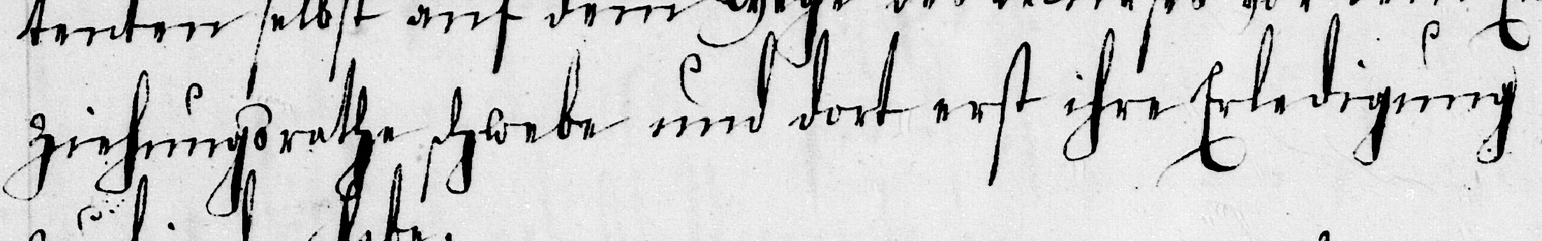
ziehungsrathe schwebe und dort erst ihre Erledigung
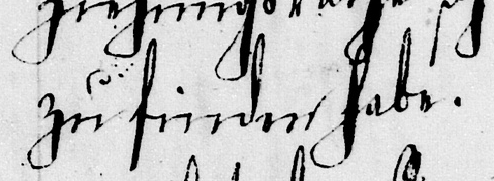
zu finden habe.
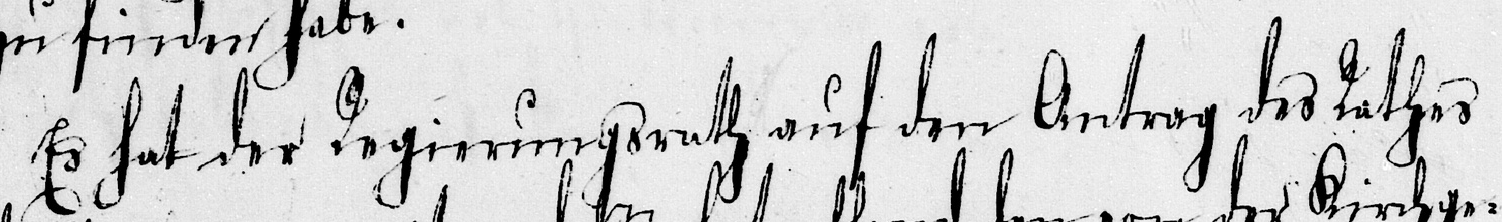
Es hat der Regierungsrath auf den Antrag des Rathes
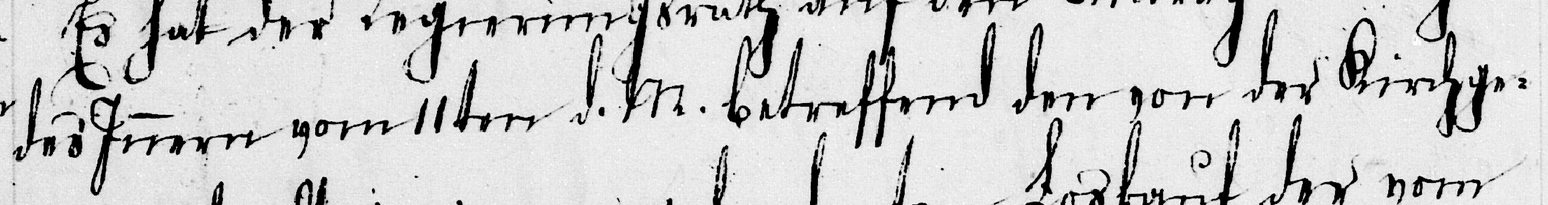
des Innern vom 11ten d. M. betreffend den von der Kirchge¬
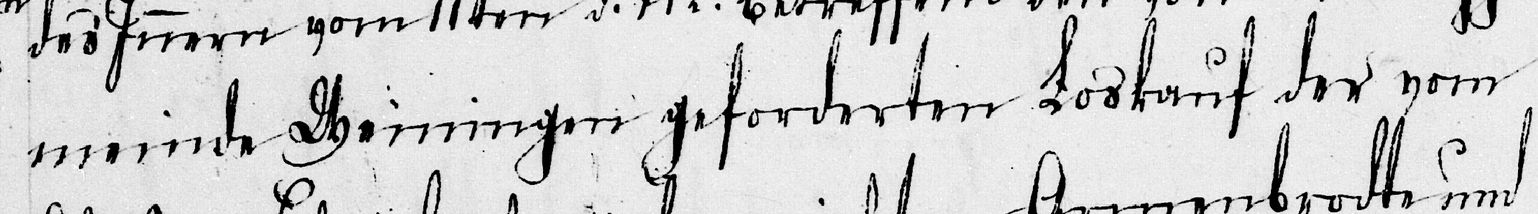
meinde Weiningen geforderten Loskauf der vom
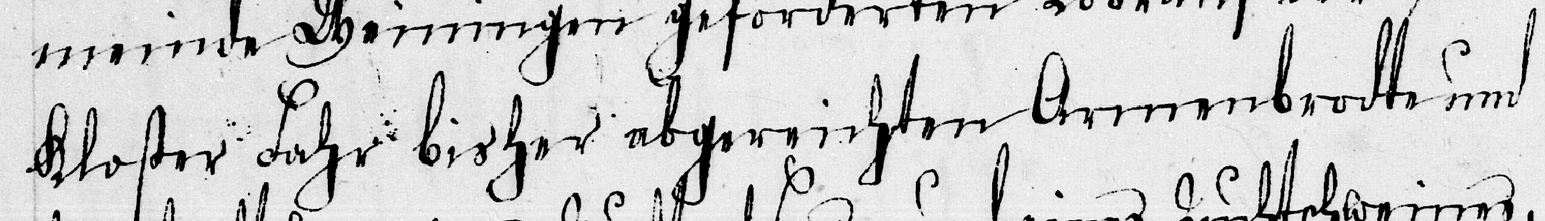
Kloster Fahr bisher abgereichten Armenbrodte und
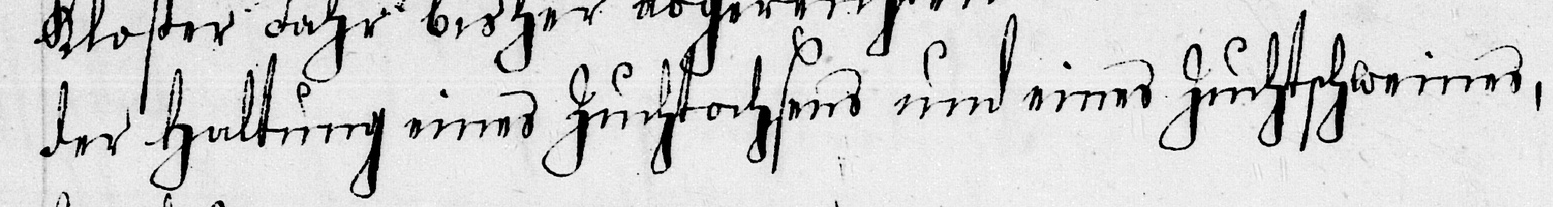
der Haltung eines Zuchtochsens und eines Zuchtschweines,
